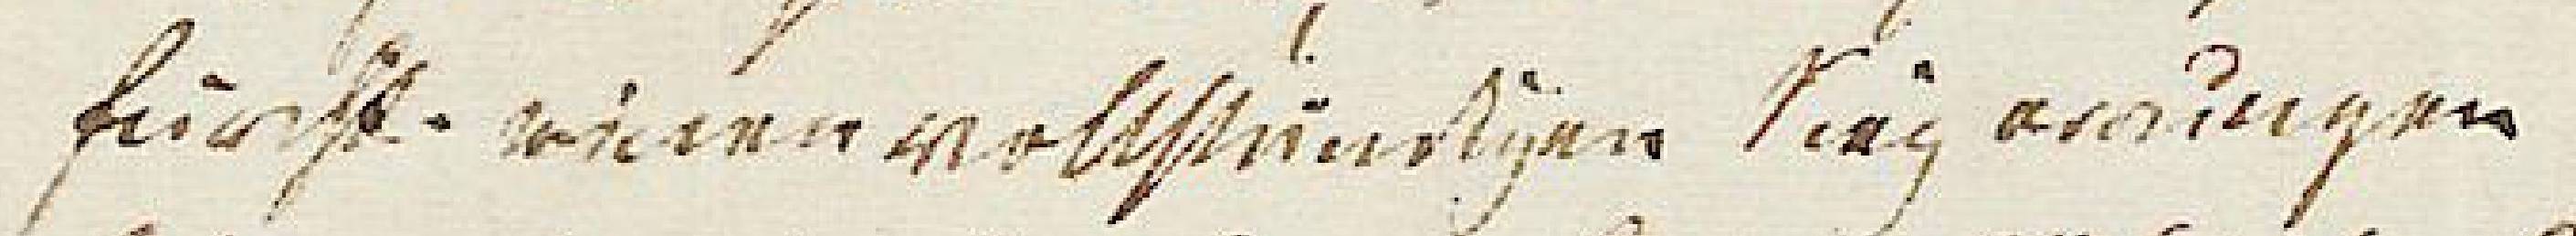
furcht einen vollständigen Sieg errungen
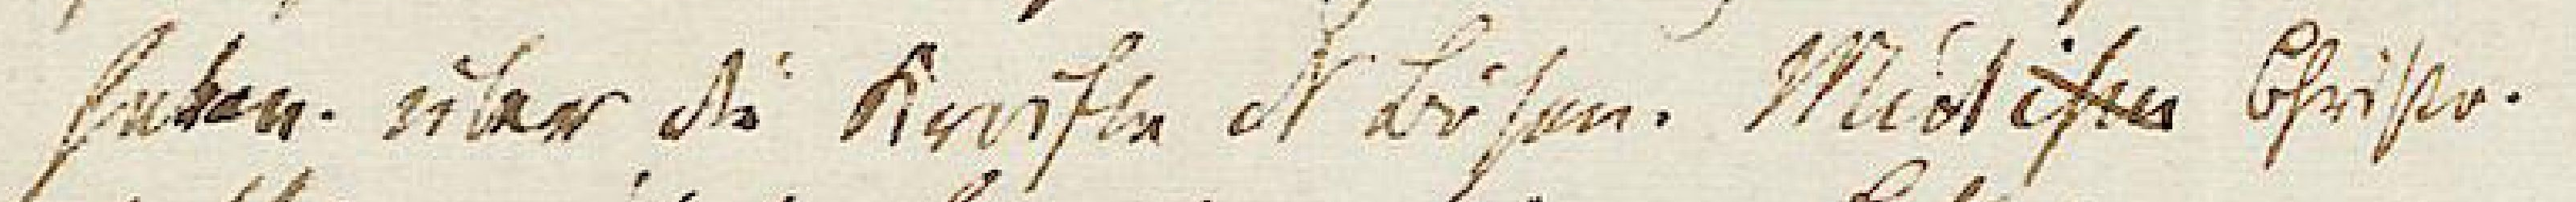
haben über die Kräfte ds Bösen. Mit ihm Christo
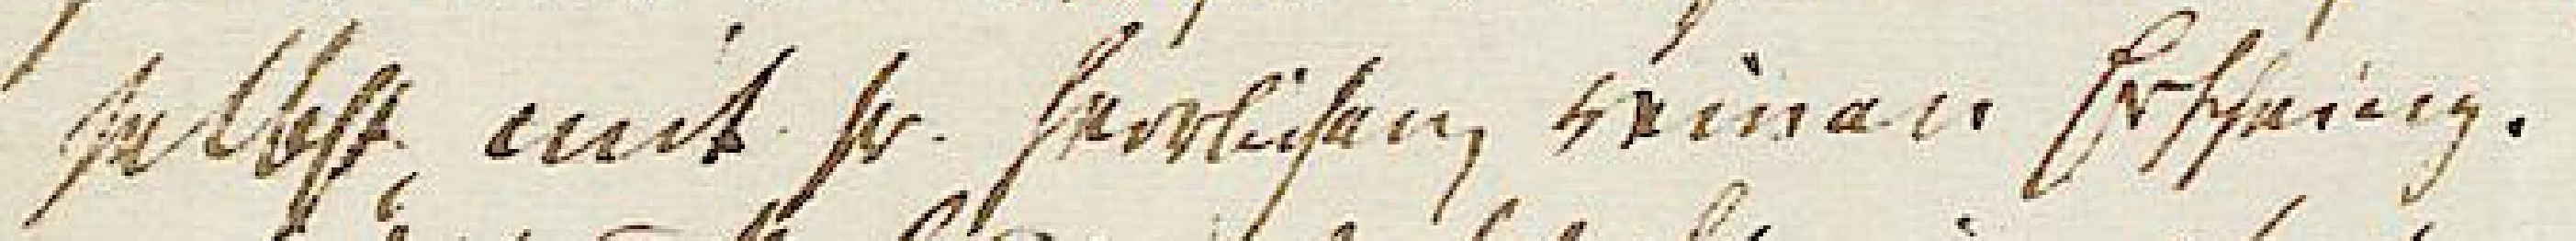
selbst, mit sr. herrlichen, reinen Erscheing.
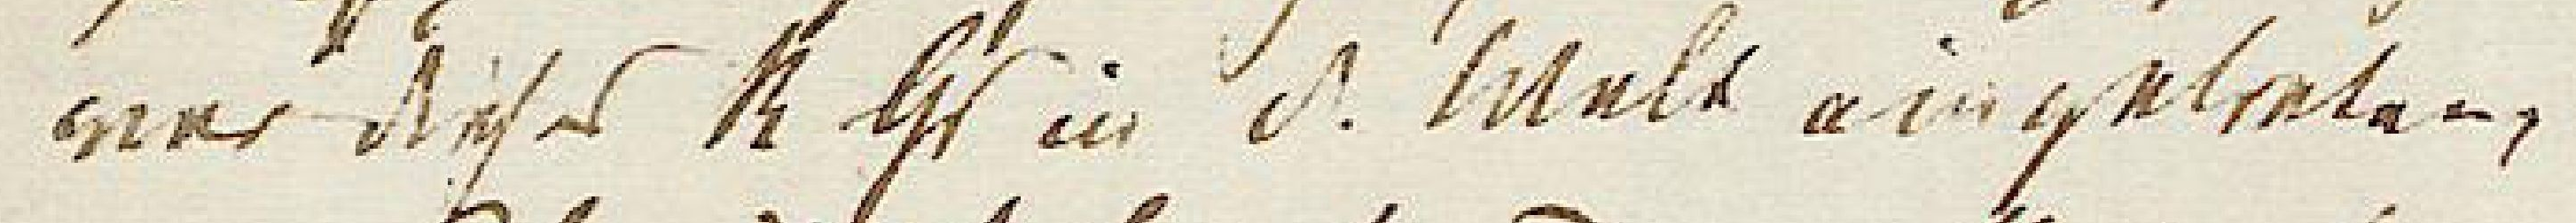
war dieses R. Gs. in d. Welt eingetreten,
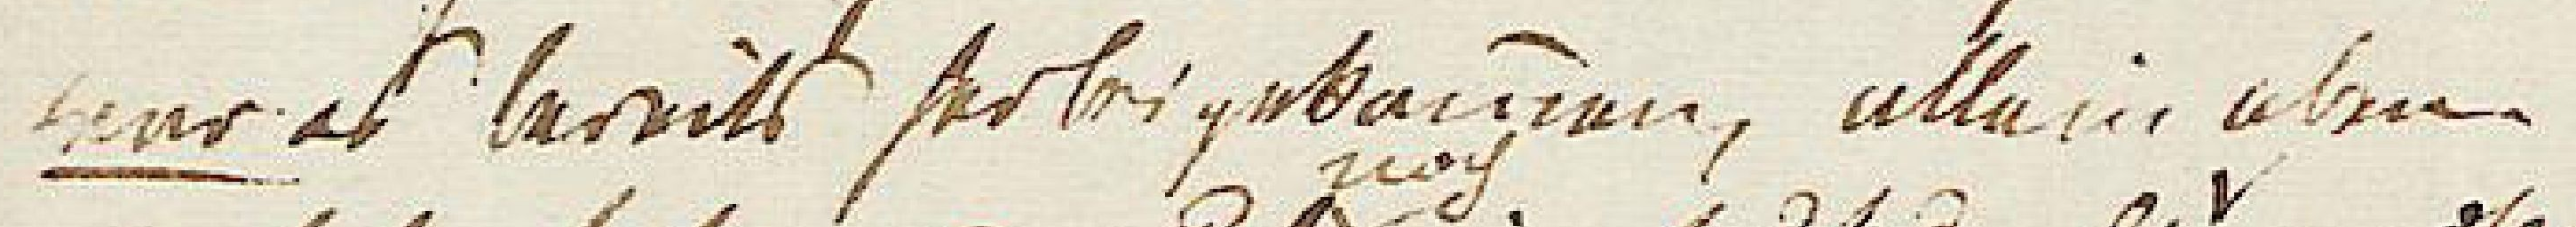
war es bereits herbeigekomen, allein eben
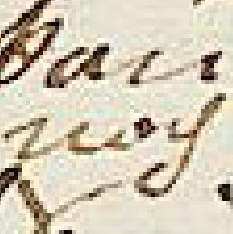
noch
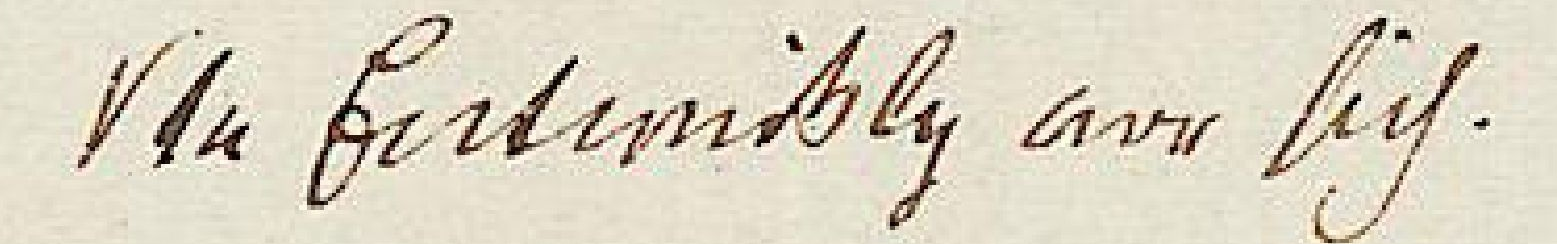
V 1n Entwicklg vor sich.
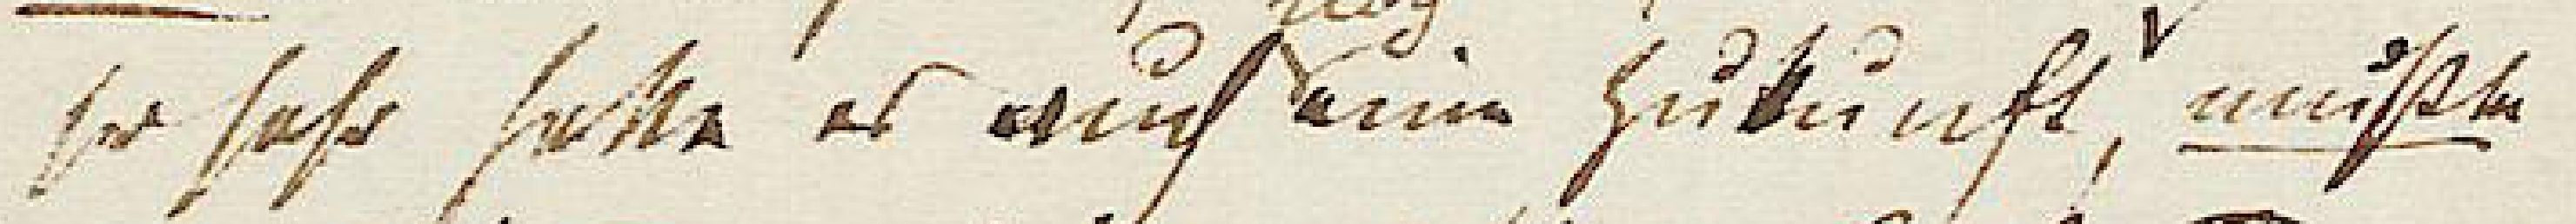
so sehr hatte es auch eine Zukungt, mußte
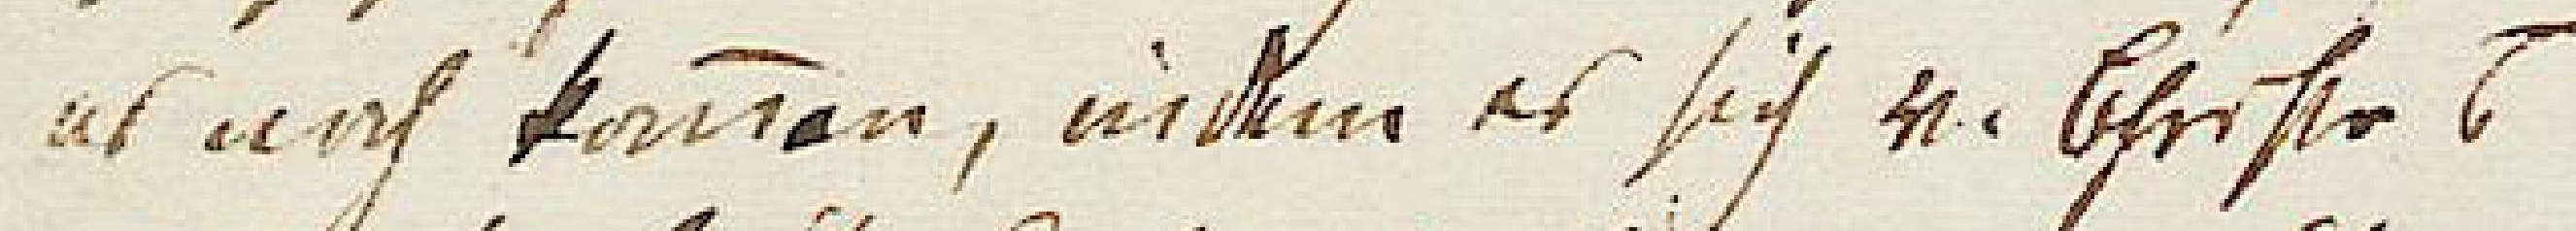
es noch komen, indem es sich v. Christo s
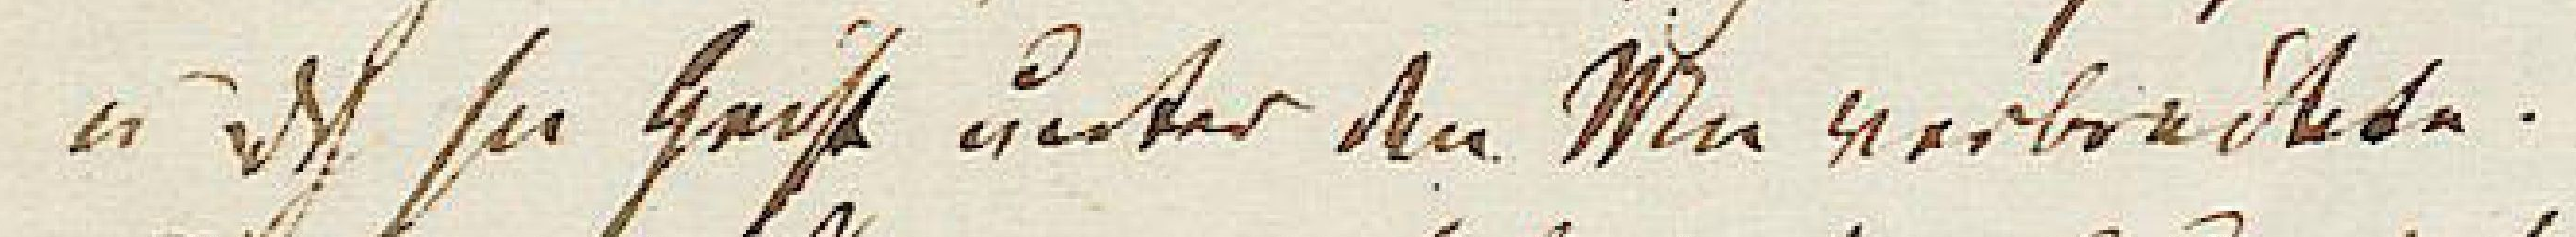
u dch sn Geist unter den Mn verbreitete.
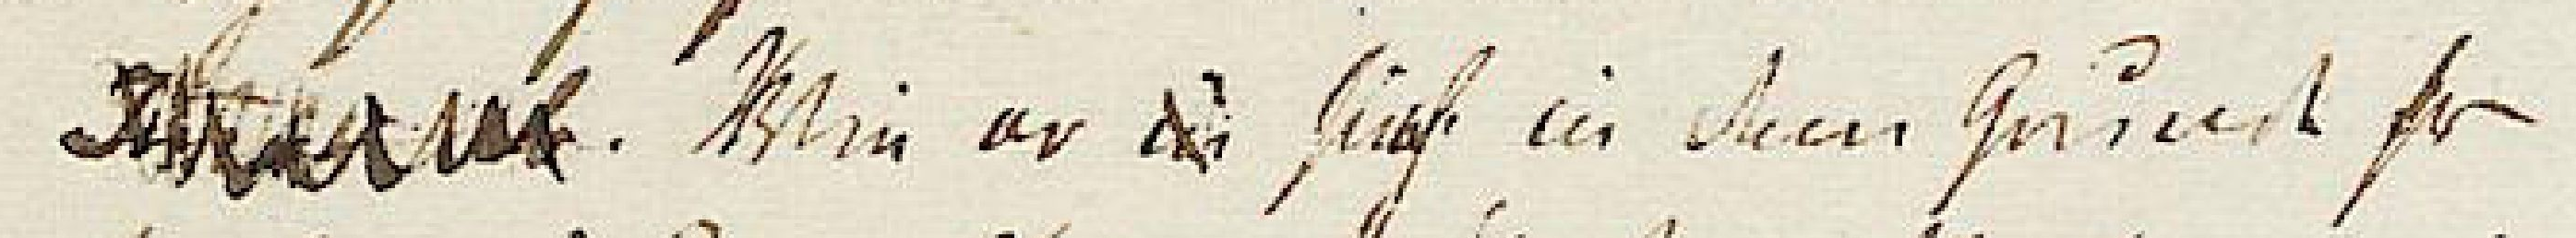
Imer ab. Wie er au tief in dem Grunde sr
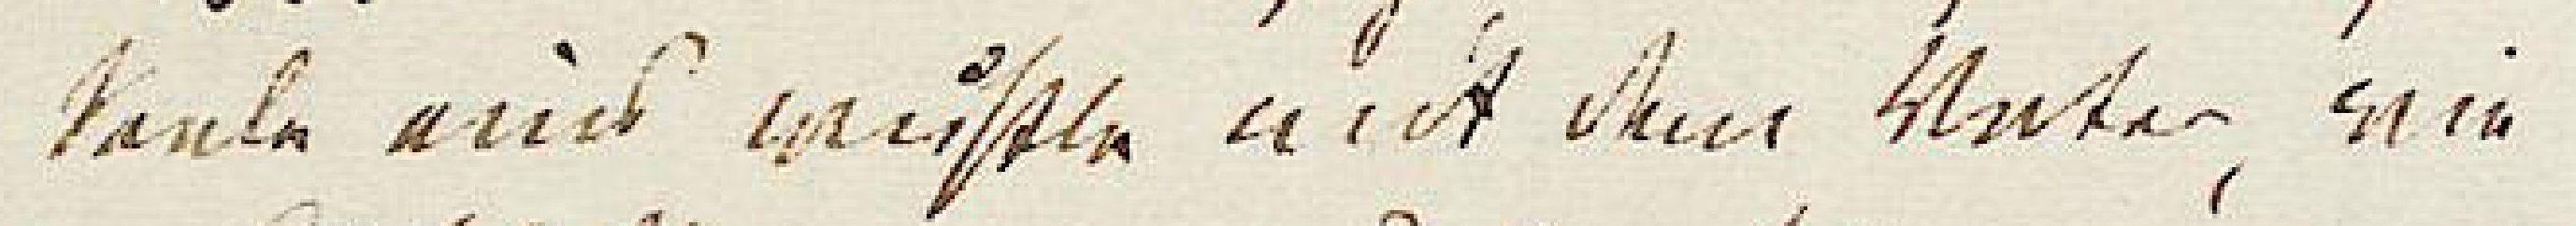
Seele eins wußte mit dem Vater, wie
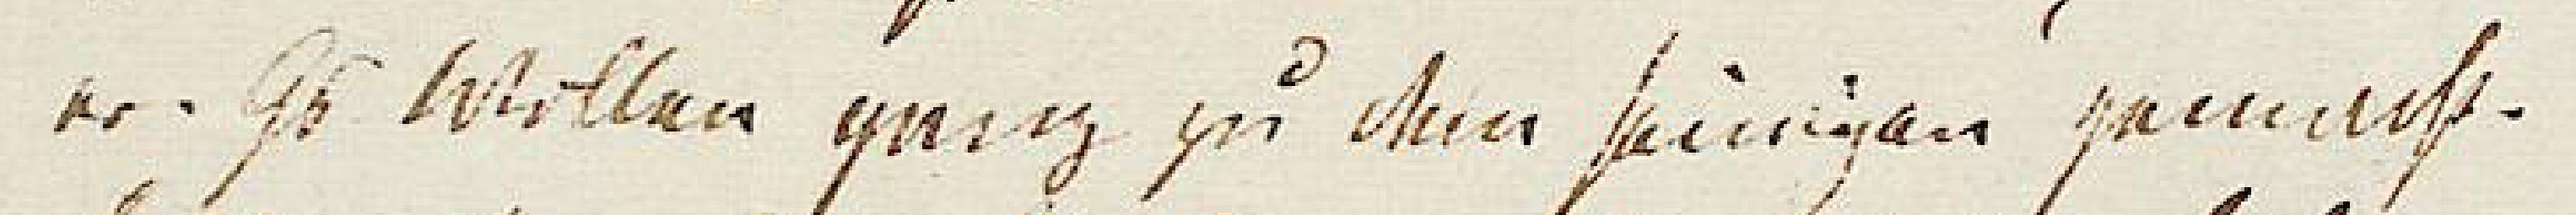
er Gs Willen ganz zu dem seinigen gemacht
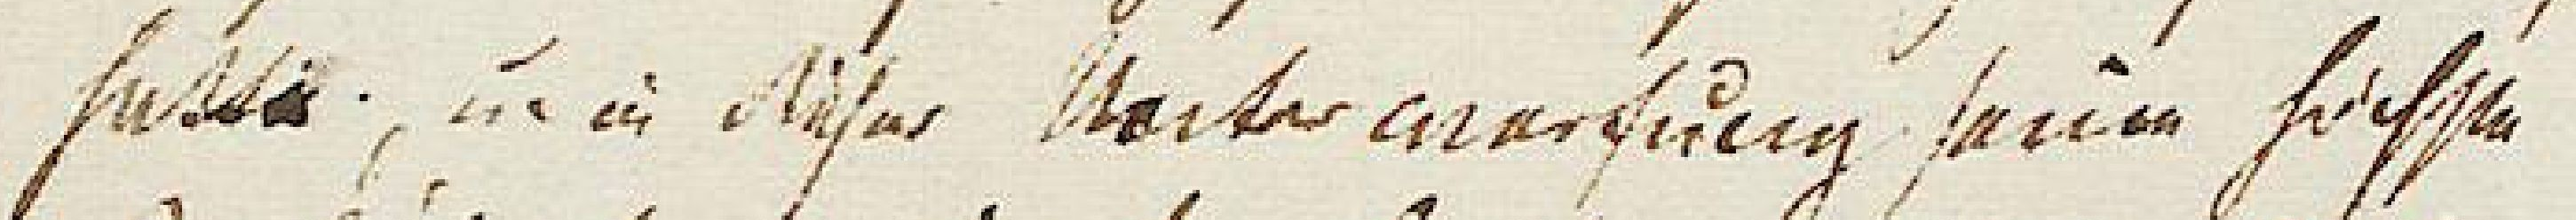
hatte, u. in diese Unterwerfung seine höchste
